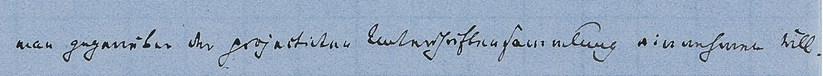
man gegenüber der projectirten Unterschriftensammlung einnehmen will.
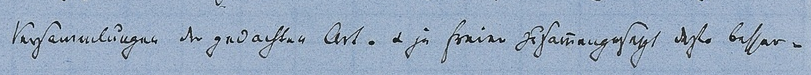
Versammlungen der gedachten Art – & je freier zusammengesetzt desto besser –
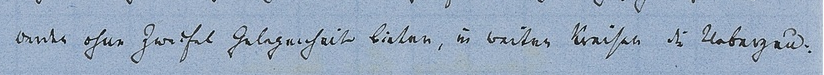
werden ohne Zweifel Gelegenheit bieten, in weiten Kreisen die Ueberzeu-
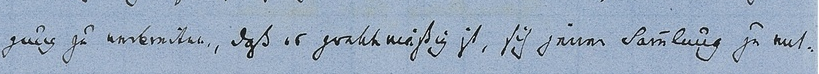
gung zu verbreiten, daß es zwekkmäßig ist, sich jener Sammlung zu ent-
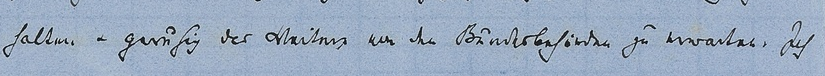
halten & geruhig das Weitere von den Bundesbehörden zu erwarten. Ich
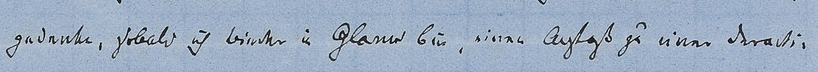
gedenke, sobald ich wieder in Glarus bin, einen Anstoß zu einer derarti-
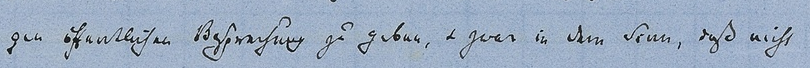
gen öffentlichen Besprechung zu geben, & zwar in dem Sinn, daß nicht
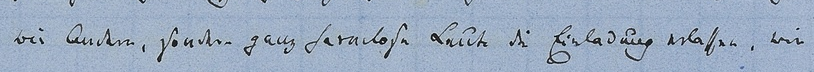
wir Andern, sondern ganz harmlose Leute die Einladung erlassen, wir
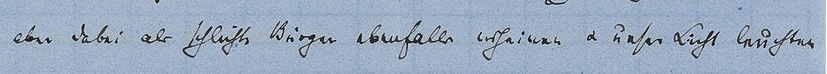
aber dabei als schlichte Bürger ebenfalls erscheinen & unser Licht leuchten
